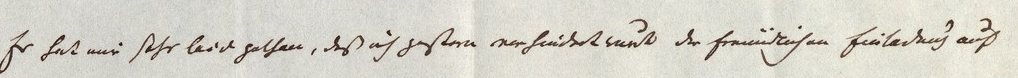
Es hat mir sehr leid gethan, daß ich gestern verhindert wurde der freundlichen Einladung auf
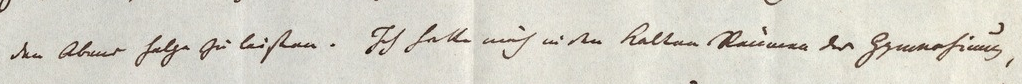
den Abend Folge zu leisten. Ich hatte mich in den kalten Räumen des Gymnasiums,
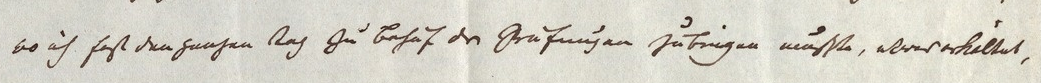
wo ich fast den ganzen Tag zu Behuf der Prüfungen zubringen mußte, etwas erkältet,
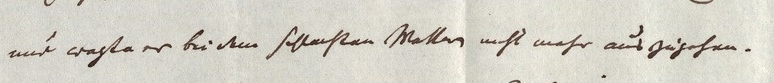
und wagte es bei dem schlechten Wetter nicht mehr auszugehen.
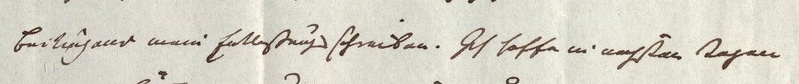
Beiliegend mein Entlastungsschreiben. Ich hoffe in nächsten Tagen
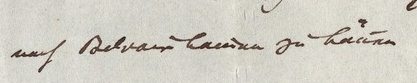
nach Belvoir kommen zu können
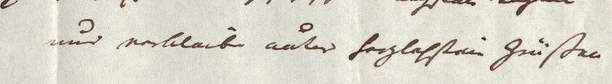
und verbleibe unter herzlichsten Grüßen
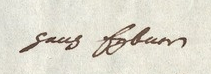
ganz Egbener
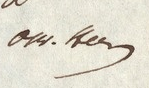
Osw. Heer
